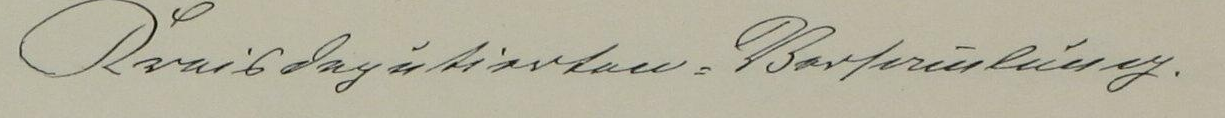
Kreisdeputierten-Versammlung.
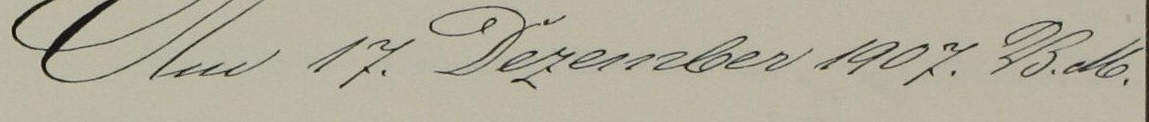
Am 17. Dezember 1907 V.M.
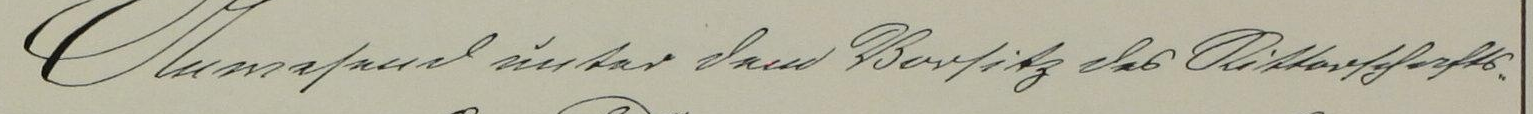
Anwesend unter dem Vorsitz des Ritterschafts-
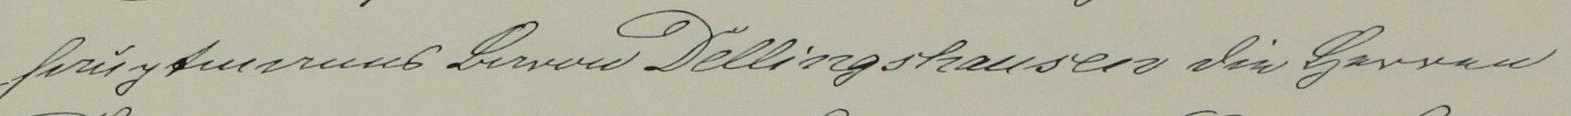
hauptmanns Baron Dellingshausen die Herren
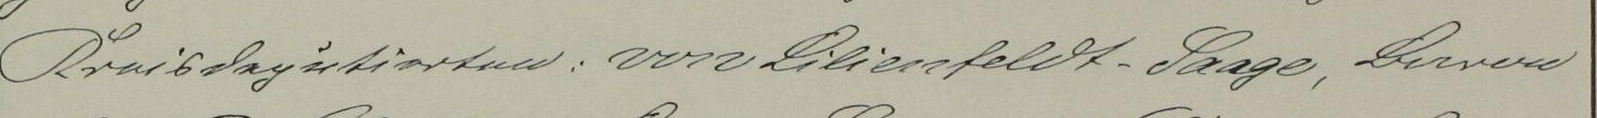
Kreisdeputierten: von Lilienfeldt-Saage, Baron
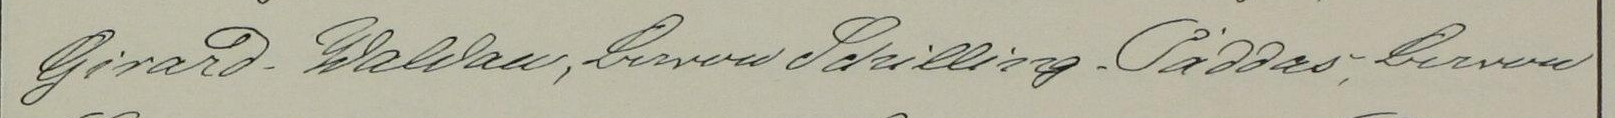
Girard-Waldau, Baron Schilling-Paddas, Baron
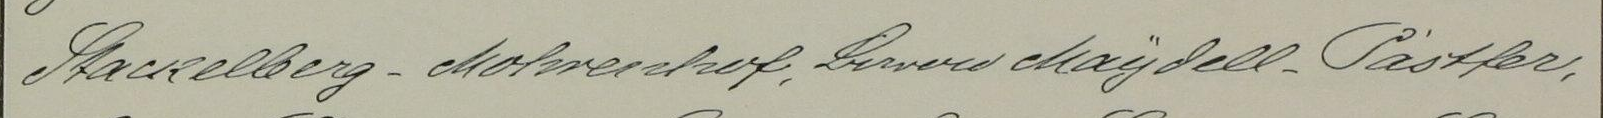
Stackelberg-Mohrenhof, Baron Maydell-Pastfer,
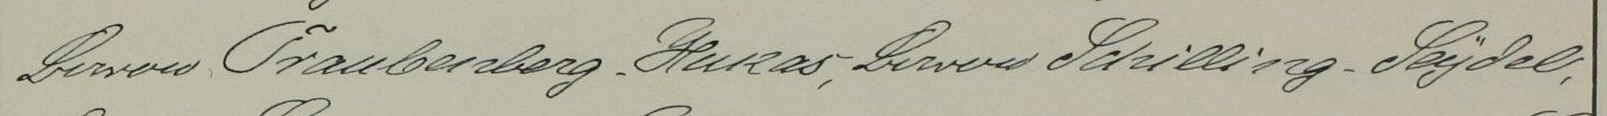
Baron Traubenberg-Hukas, Baron Schilling-Seydel,
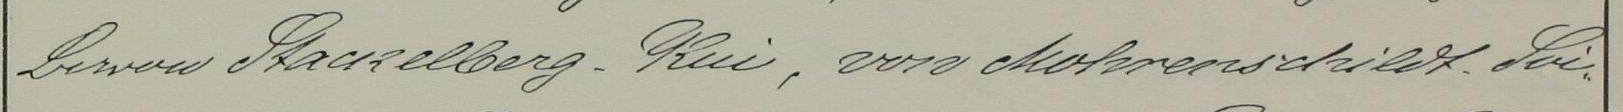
Baron Stackelberg-Kui, von Mohrenschildt-Soi-
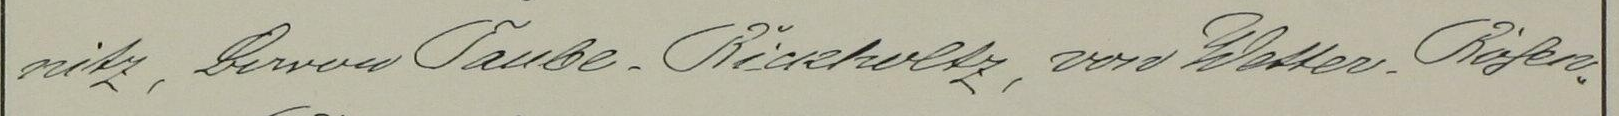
nitz, Baron Taube-Rickholtz, von Wetter-Rosen-
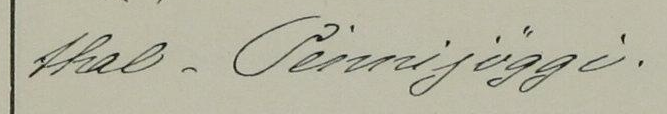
thal-Pennijöggi.
